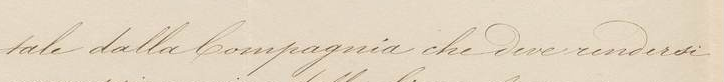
tale dalla compagnia che deve rendersi
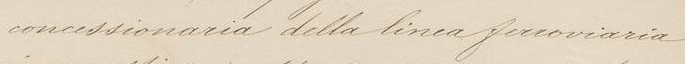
concessionaria della linea ferroviaria
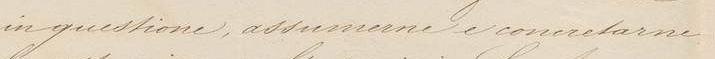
in questione, assumerne e concretarne
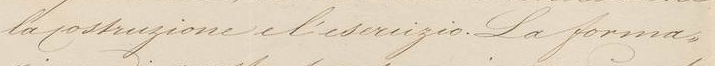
la costruzione e l'esercizio. La forma-
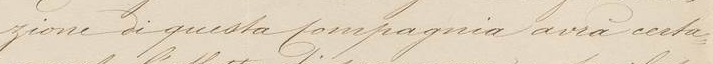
zione di questa compagnia avrà certa-
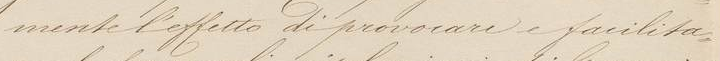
mente l'effetto di provocare e facilita-
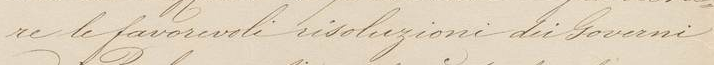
re le favorevoli risoluzioni dei Governi
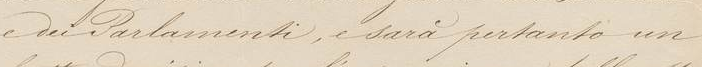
e dei Parlamenti, e sarà pertanto un
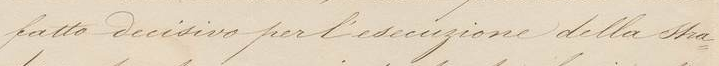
fatto decisivo per l'esecuzione della stra-
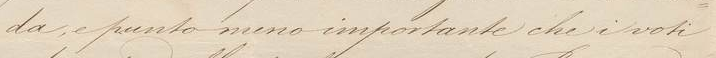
da, e punto meno importante che i voti
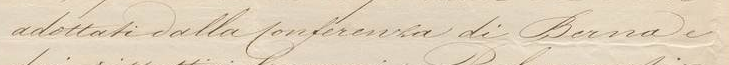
adottati della conferenza di Berna e
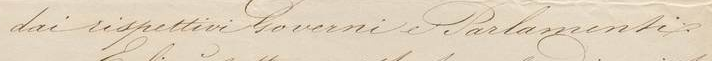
dai respettivi Governi e Parlamenti:
